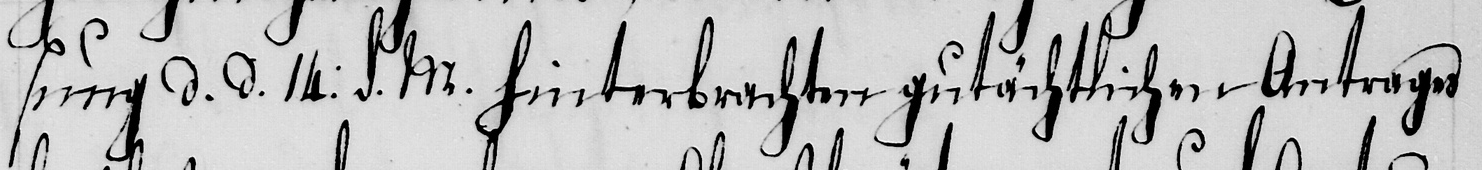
sung d. d. 14. d. M. hinterbrachten gutächtlichen Antrages
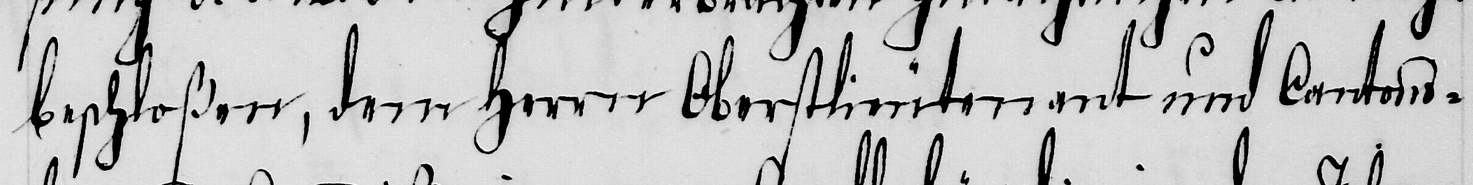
beschloßen, dem Herrn Oberstlieutenant und Cantons¬
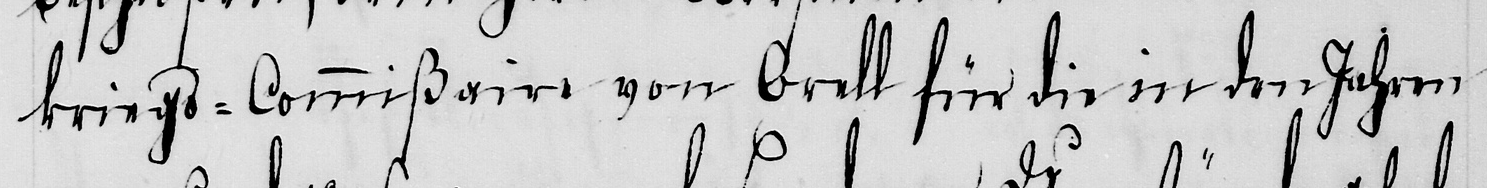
kriegs-Commißaire von Orell für die in den Jahren
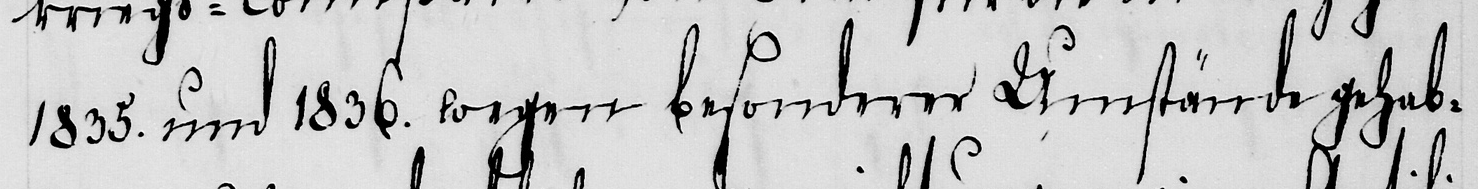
1835. und 1836. wegen besonderer Umstände gehab¬
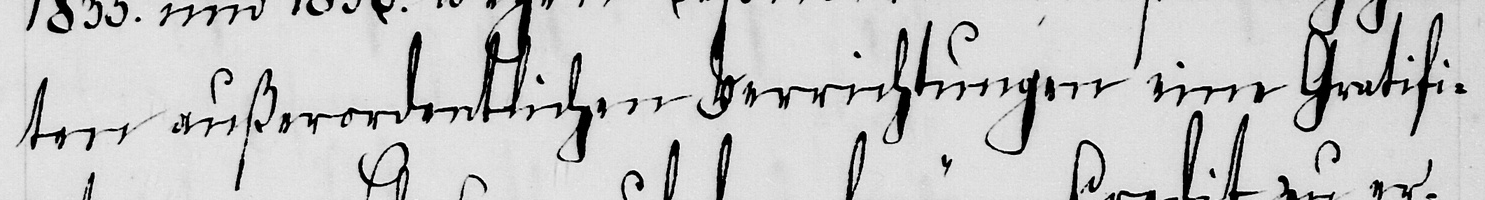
ten außerordentlichen Verrichtungen eine Gratific¬
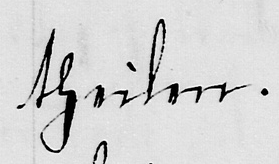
theilen.
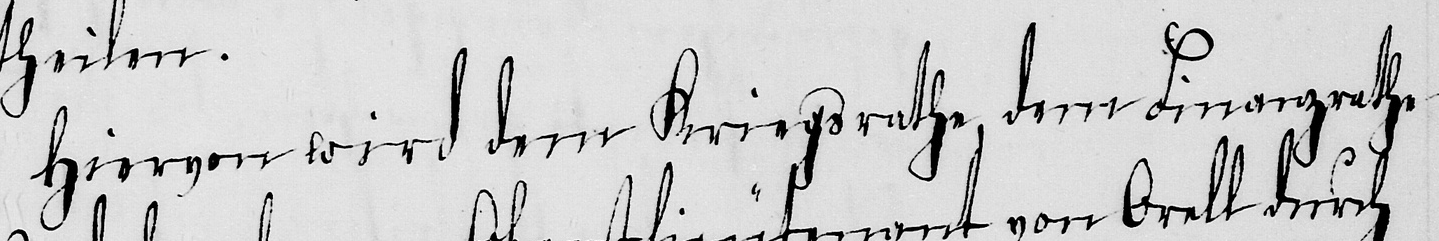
Hiervon wird dem Kriegsrathe, dem Finanzrathe
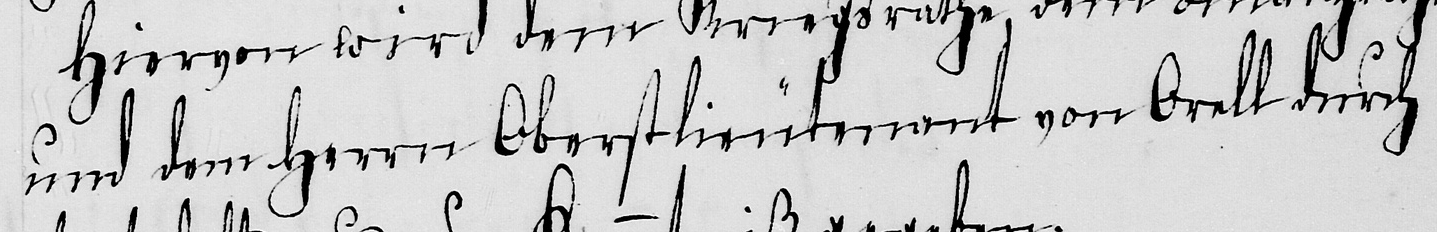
und dem Herrn Oberstlieutenant von Orell durch
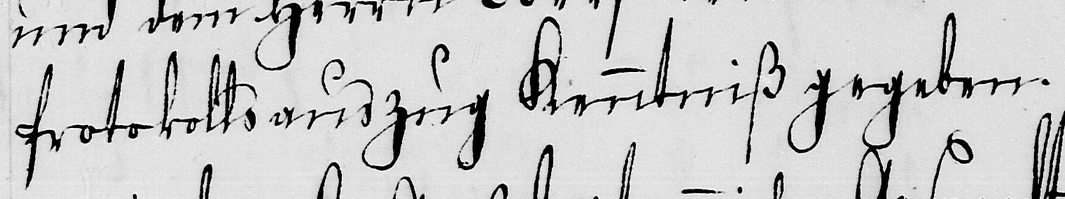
Protokollsauszug Kenntniß gegeben.
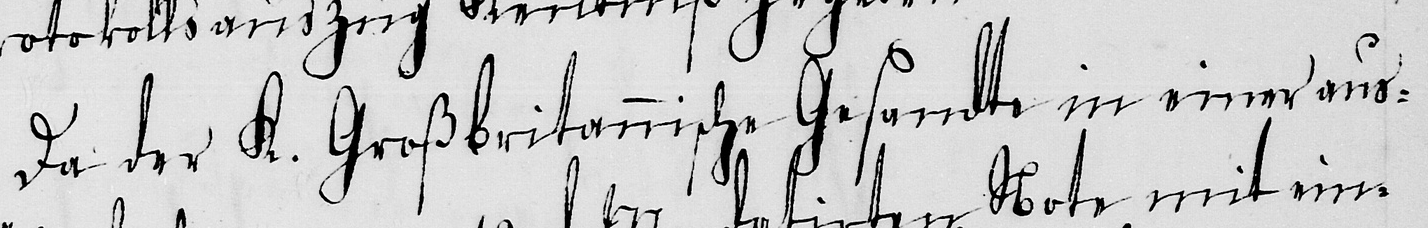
Da der K. Großbritannische Gesandte in einer aus¬
